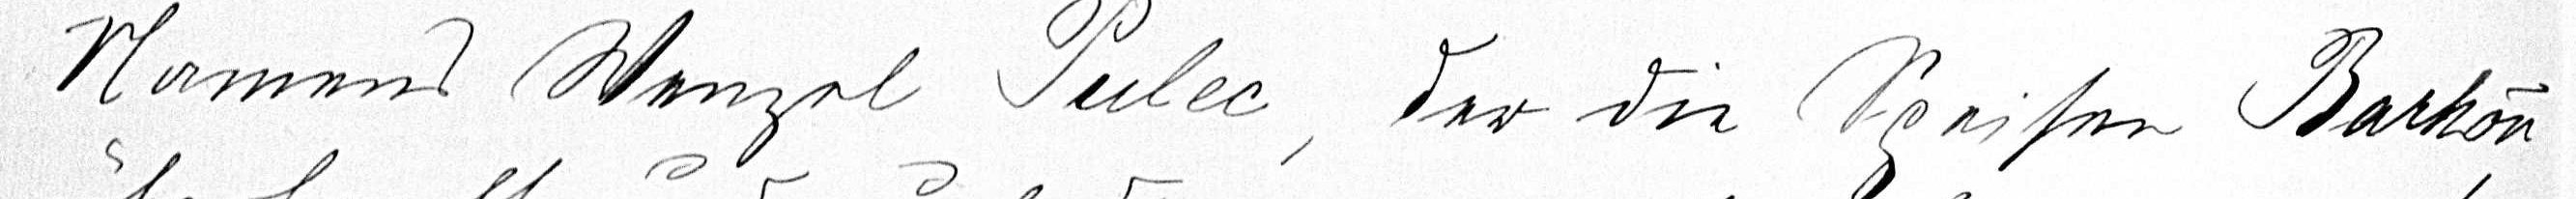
Namens Wenzel Pulec, der die Speisen Barkxx
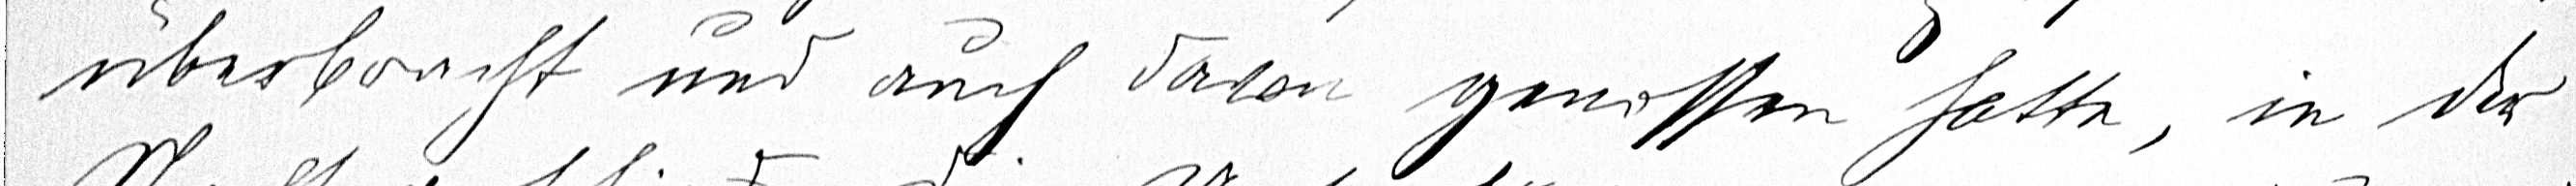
überbracht und auch davon genossen hatte, in der
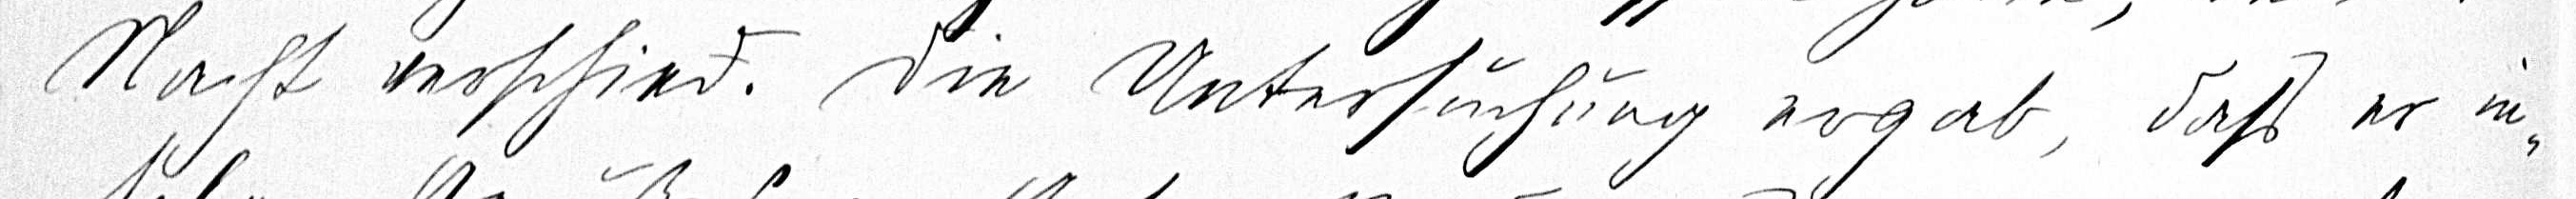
Nacht verschied. Die Untersuchung ergab, dass er in¬
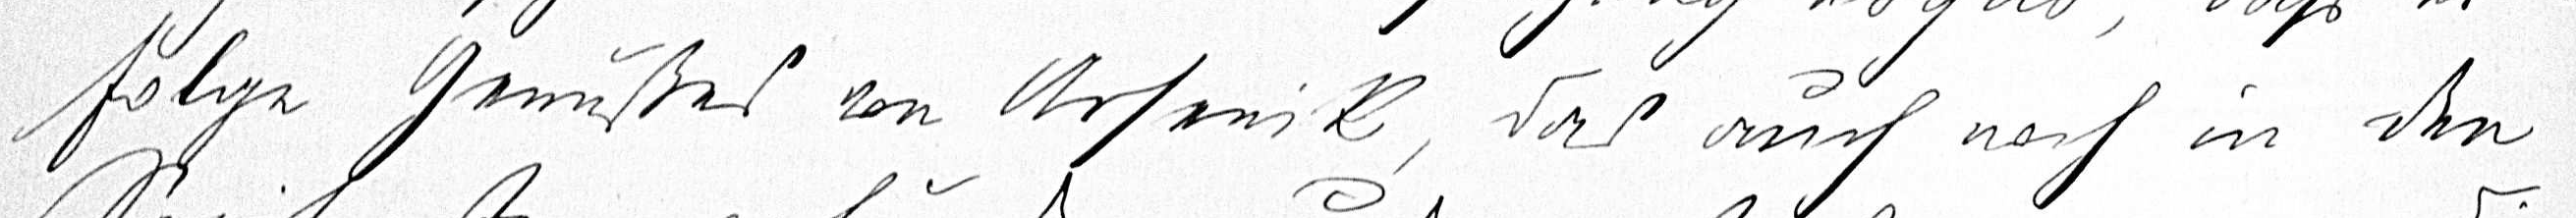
folge Genußes von Ursenik, das auch noch in den
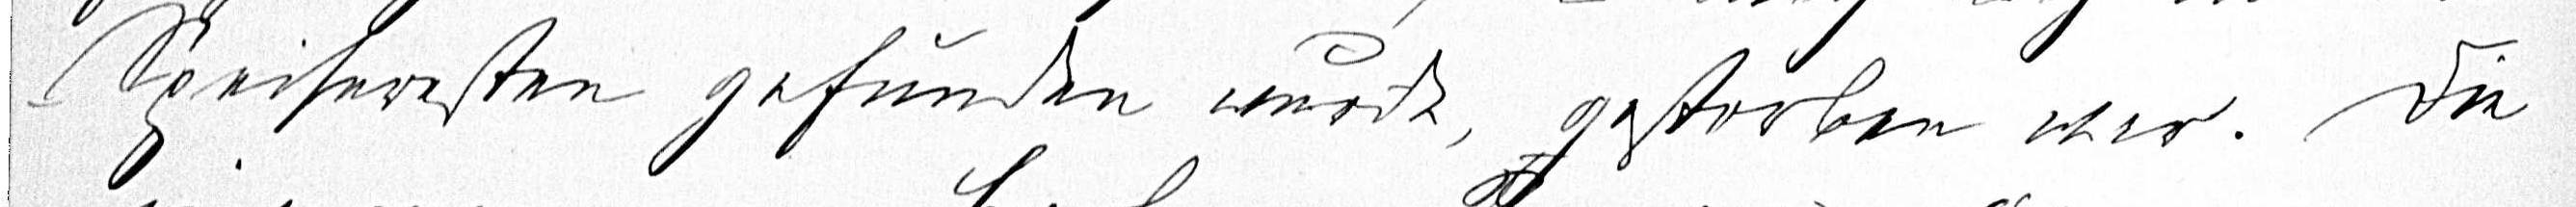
Speisersten gefunden wurde, gestorben war. Die
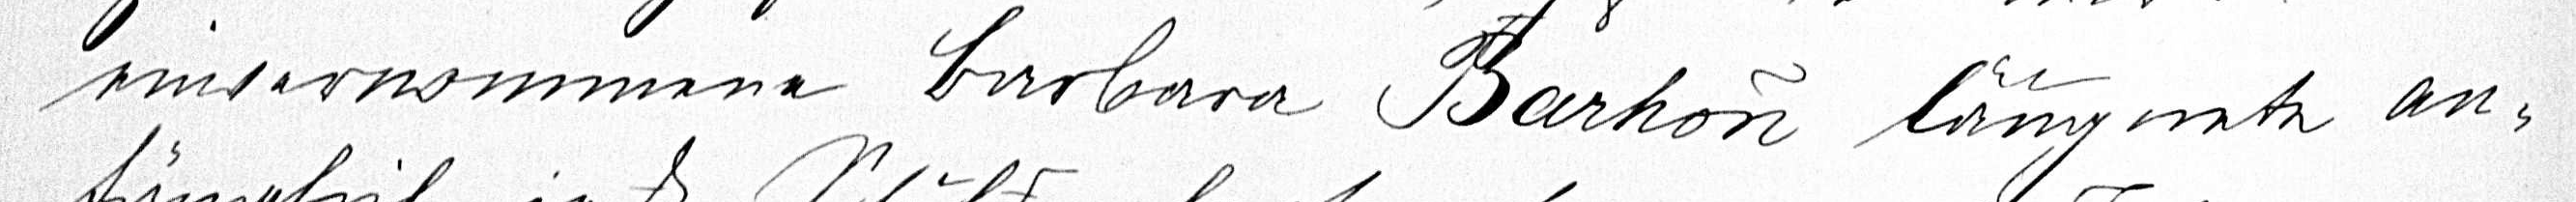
einvernommene Barbara Barhxx läugnete an¬
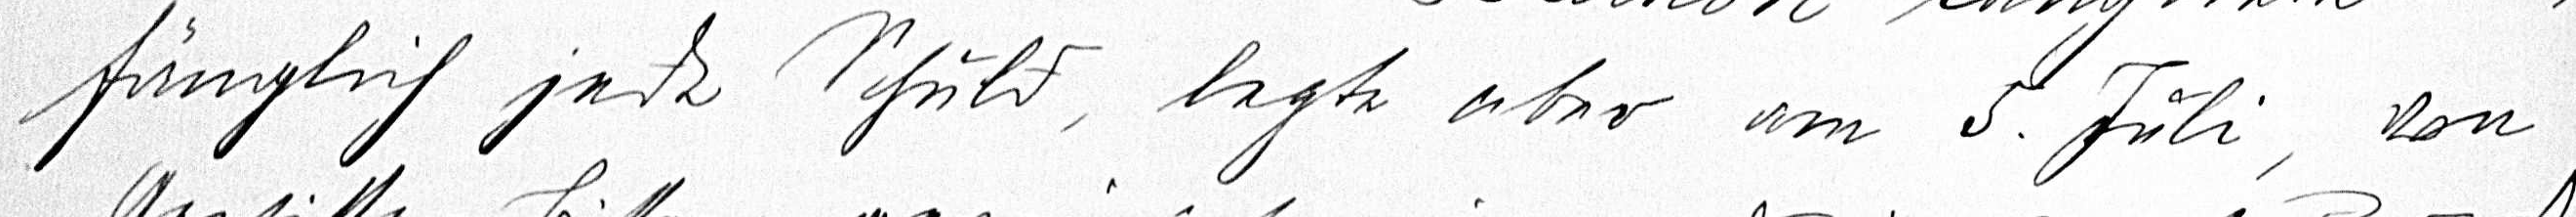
hänglich jede Schuld, legte aber am 5. Juli, von
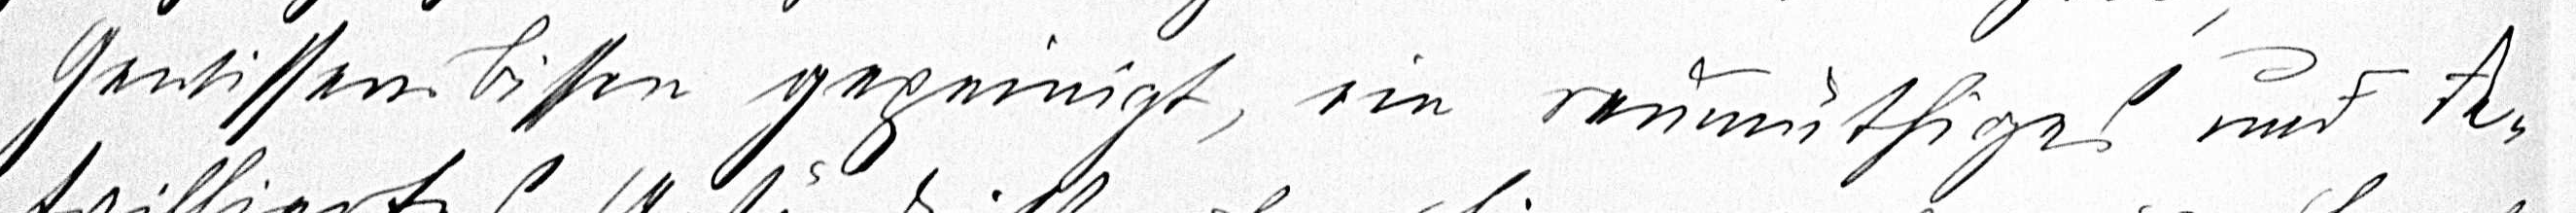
Gewissen bissen gepeinigt, ein reumüthiges und De¬
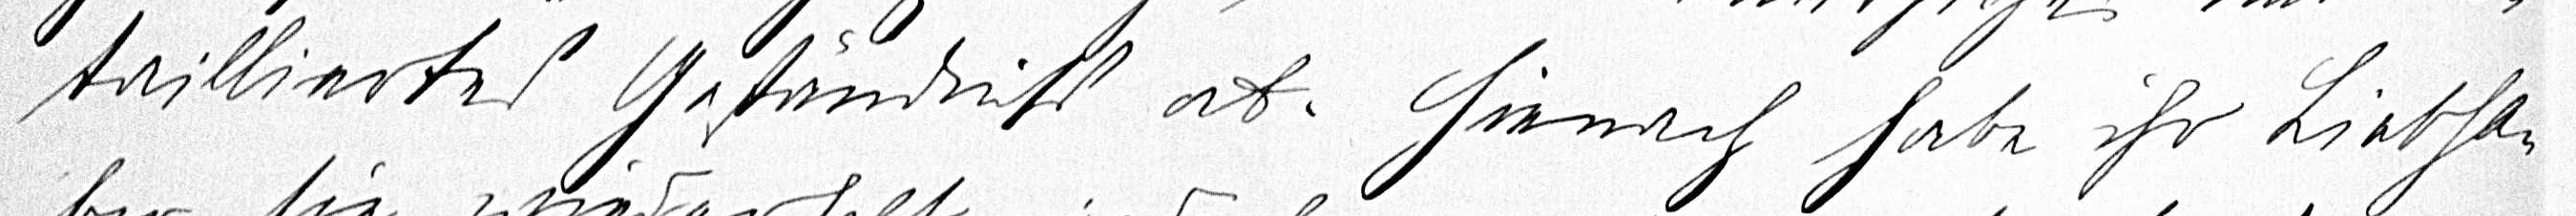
tailliertes Geständniss xx. Hienach habe ihr Liebha¬
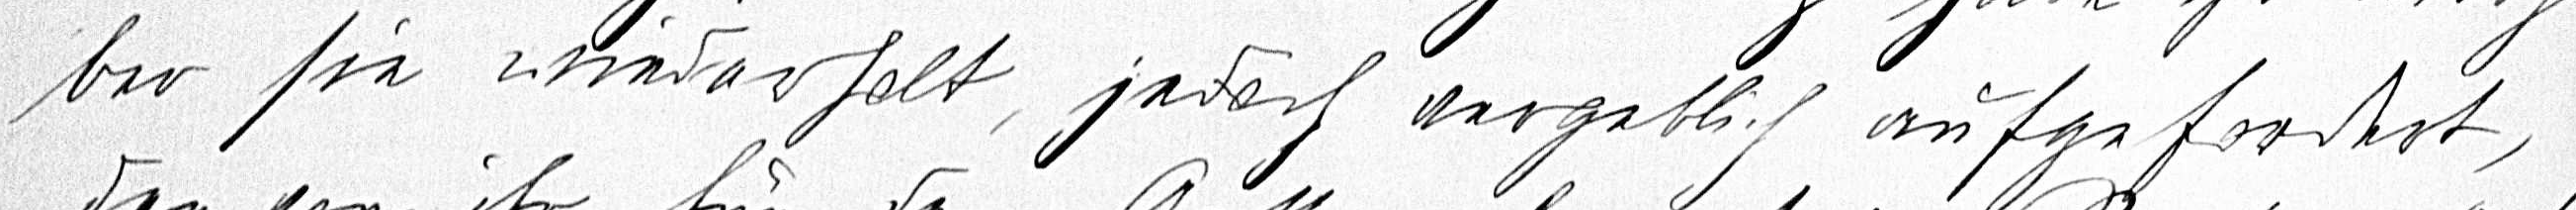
ber sie wiederholt, jedoch vergeblich aufgefordert,
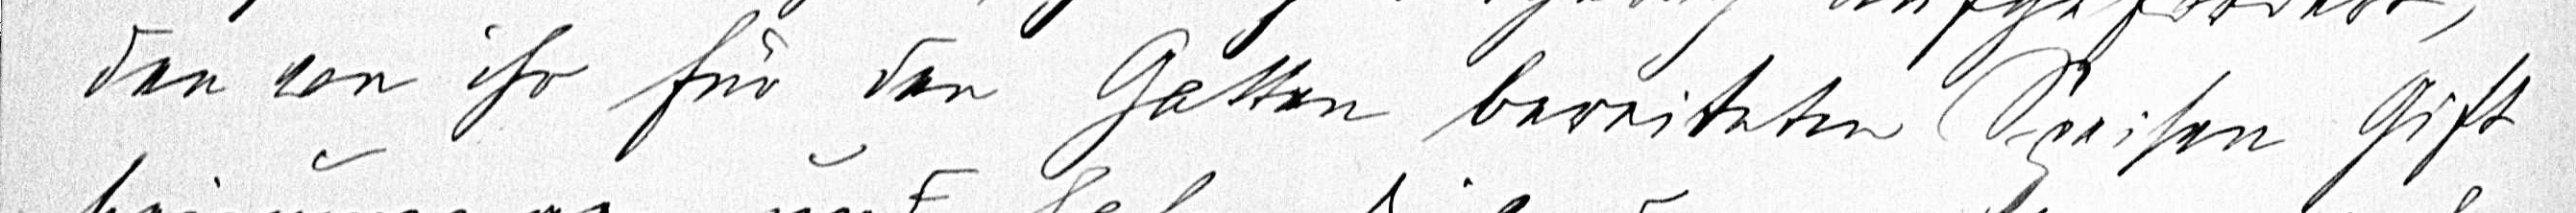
den von ihr für den Gatten bereiteten Speisen Gift
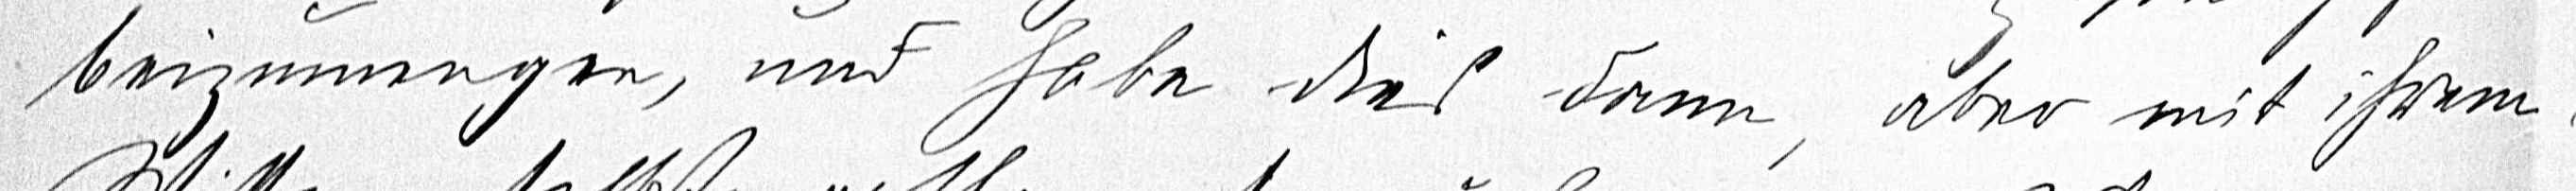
beizumengen, und habe dies dann, aber mit ihrem
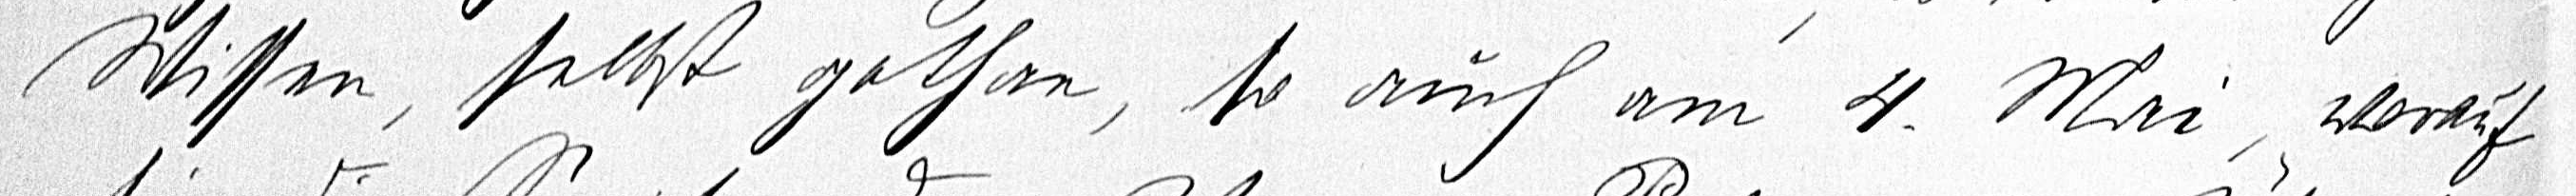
Wissen, selbst gethan, so auch am 4. Mai, vorauf
